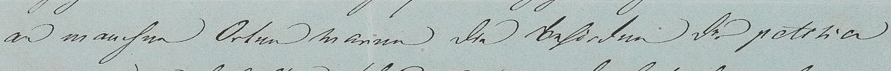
an manchen Orten waren die Behörden der petition
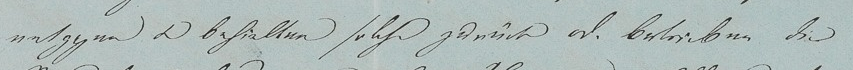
entgegen & behielten solche zurück od. betrieben die
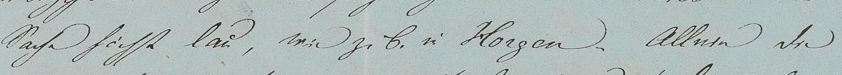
Sache höchst lau, wie z. B. in Horgen. Allein die
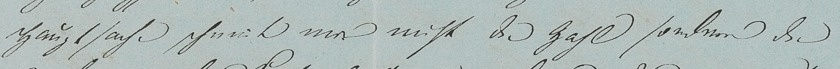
Hauptsache scheint mir nicht die Zahl sondern die
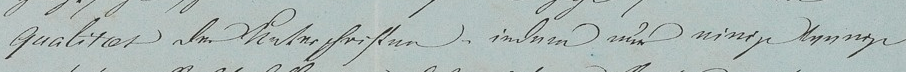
Qualitæt der Unterschriften, indem nur einige Wenige
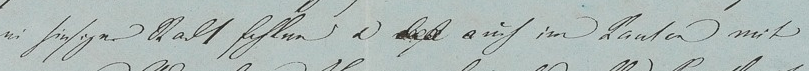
in hiesiger Stadt fehlen & auch im Kanton mit
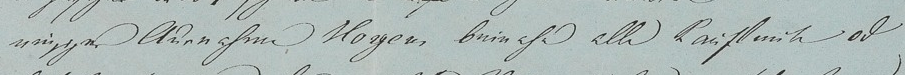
einziger Ausnahme Horgens beinahe alle Kaufleute od
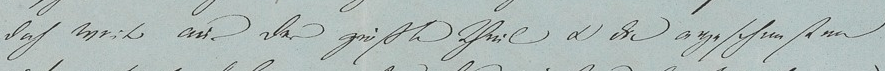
doch weit aus der größte Theil & die angesehensten
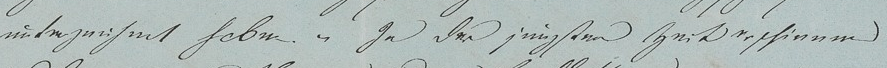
unterzeichnet haben. In der jüngsten Zeit erschienen
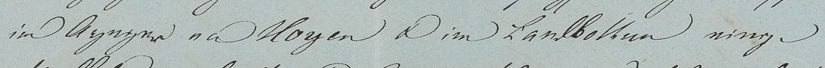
im Anzeiger von Horgen & im Landbotten einige
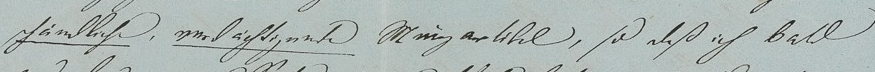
schändliche, verdächtigende Münzartikel, so daß ich bald
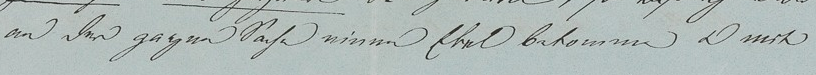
an der ganzen Sache einen Ekel bekomme & mit
